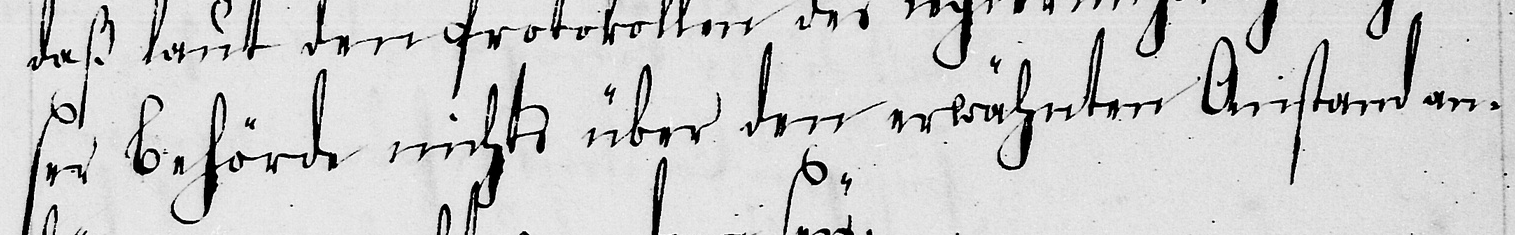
ser Behörde nichts über den erwähnten Anstand an¬
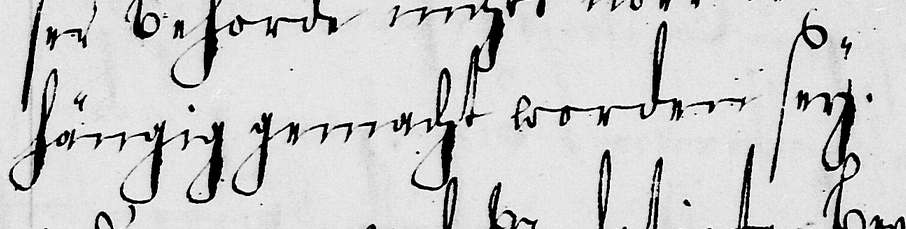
hängig gemacht worden sey.
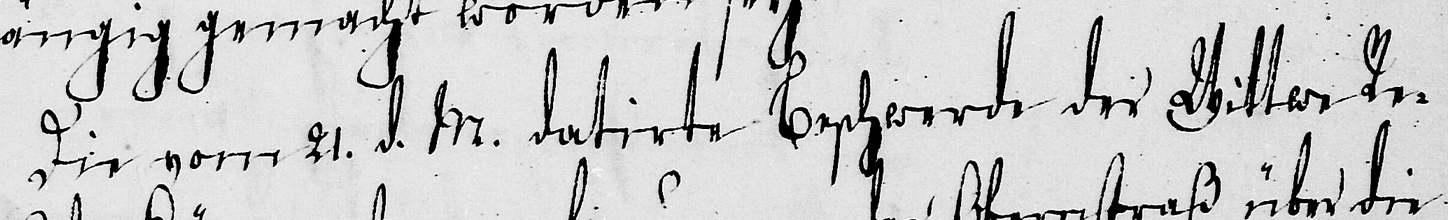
Die vom 21. d. M. datirte Beschwerde der Wittwe Re¬
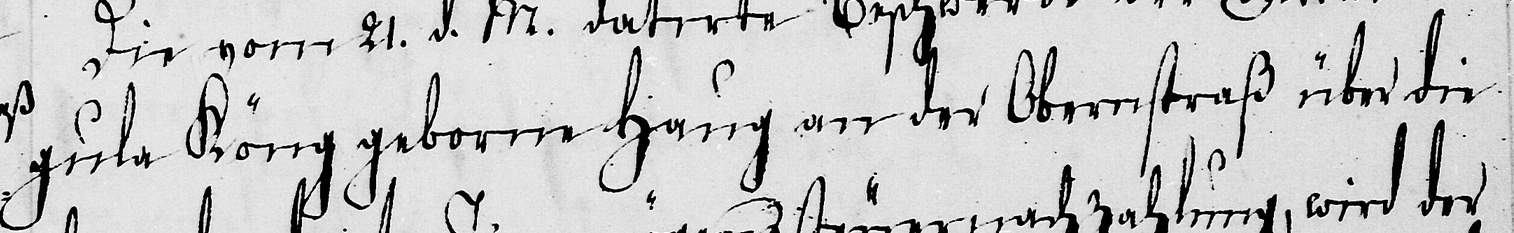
gula Köng geborne Haug an der Obernstraß über die
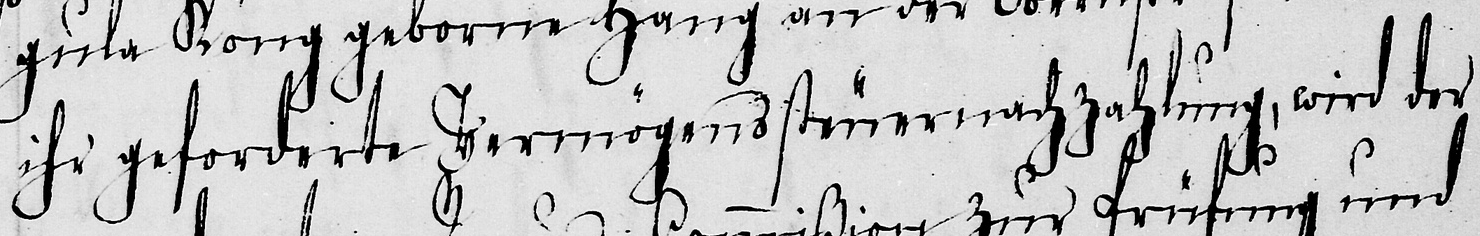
ihr geforderte Vermögenssteuernachzahlung, wird der
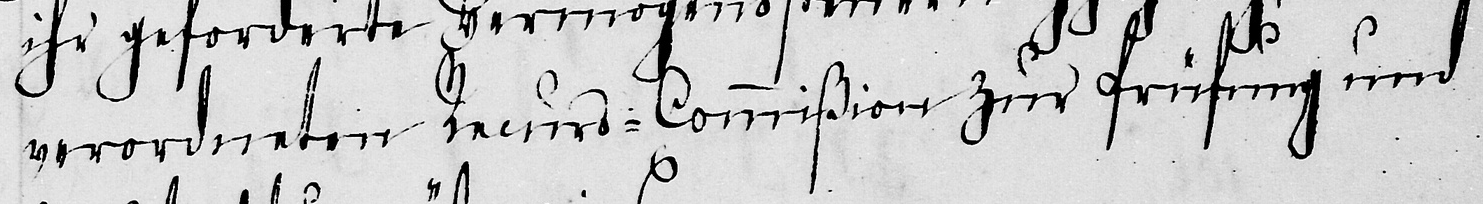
verordneten Recurs-Commißon zur Prüfung und
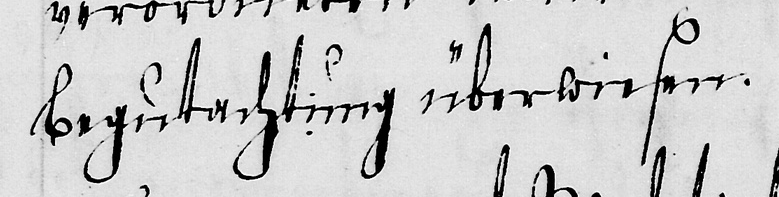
Begutachtung überwiesen.
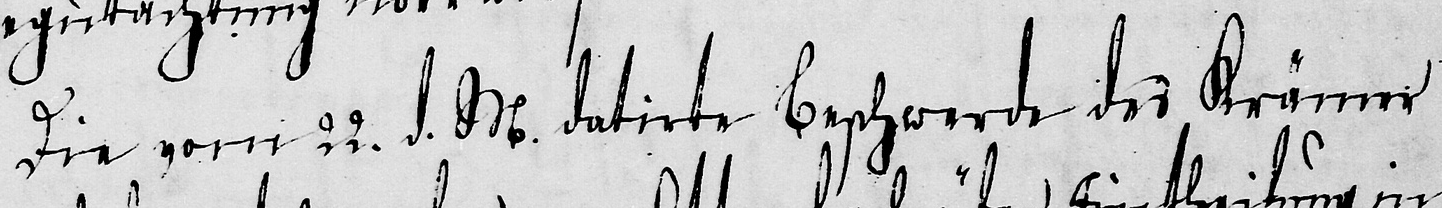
Die vom 22. d. M. datirte Beschwerde des Krämer
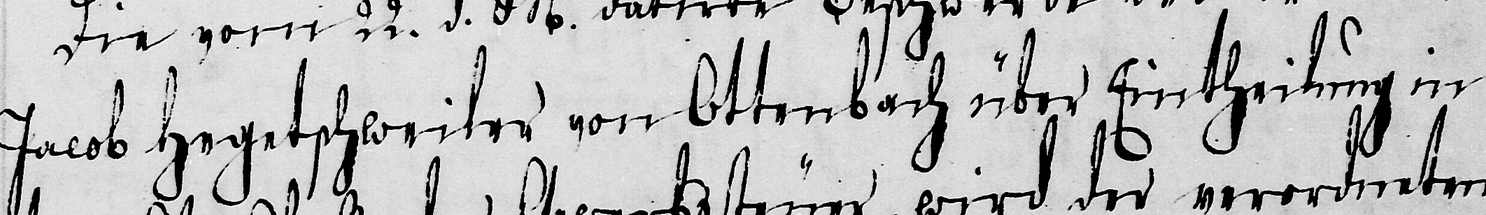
Jacob Hegetschweiler von Ottenbach über Eintheilung in
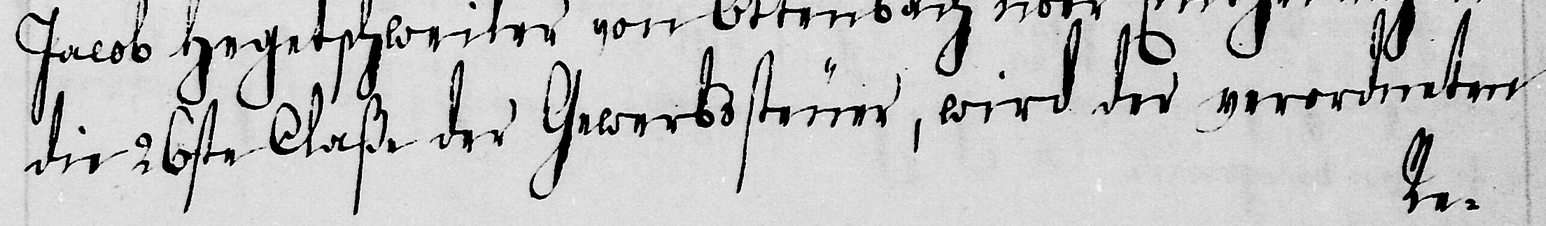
die 26ste Claße der Gewerbssteuer, wird der verordneten
